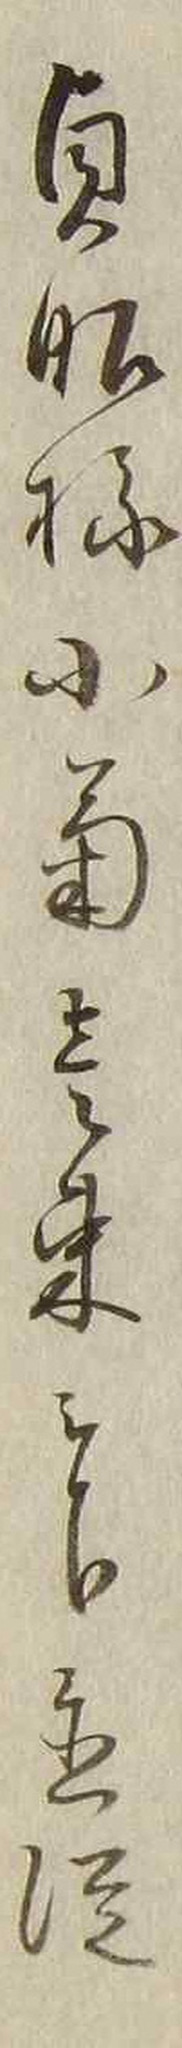貞昭様小菊壱束被下置従

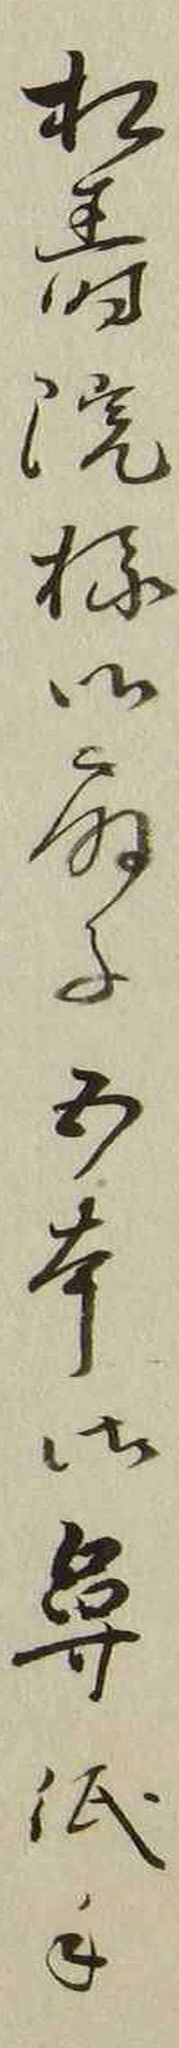松寿院様御扇子五本御鼻紙手
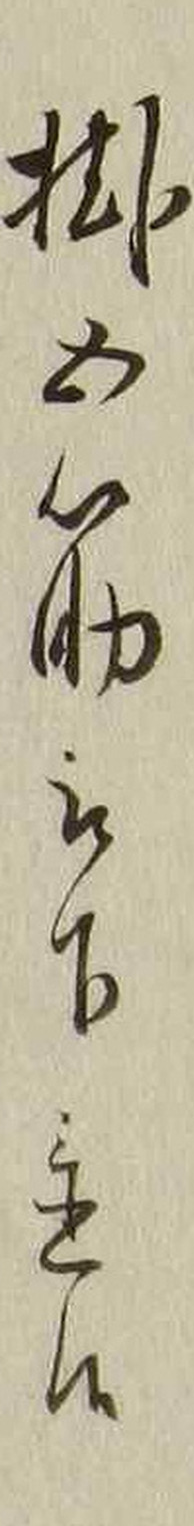掛五筋被下置候
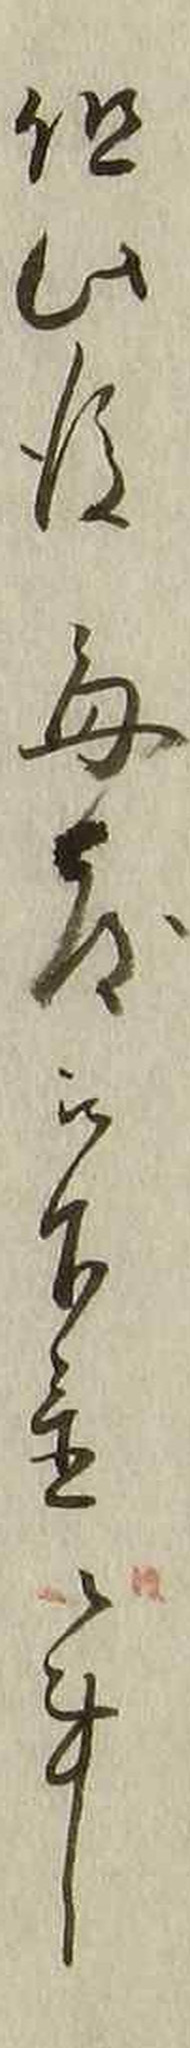但此後毎度被下置候事
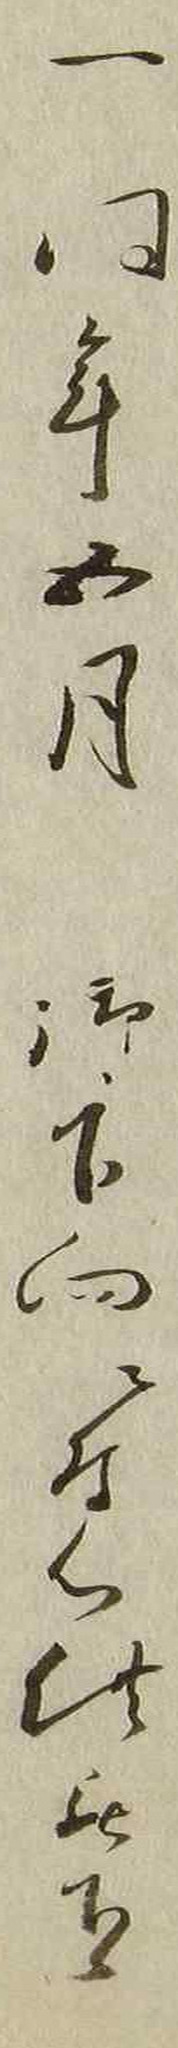一同年五月御下向ニ付被下候
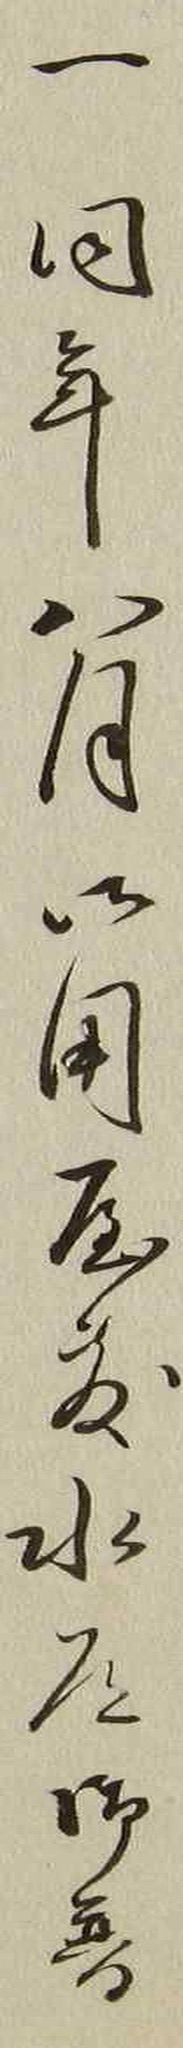一同年八月御用屋敷水道御普
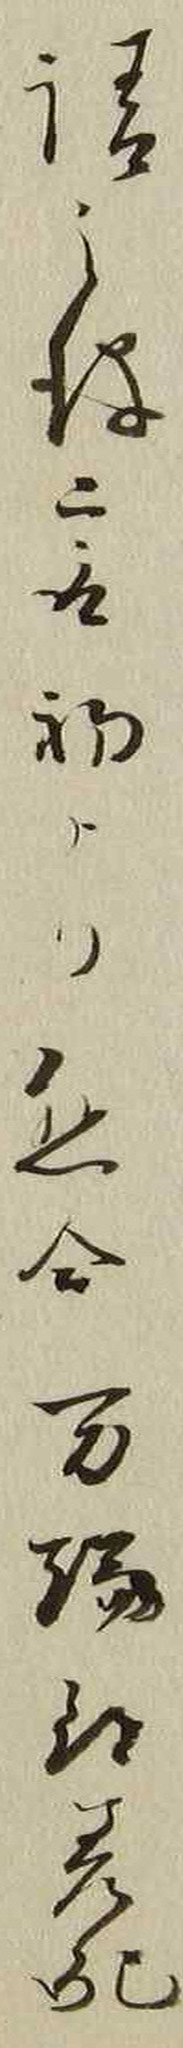請之儀最初より懸合万端被差配
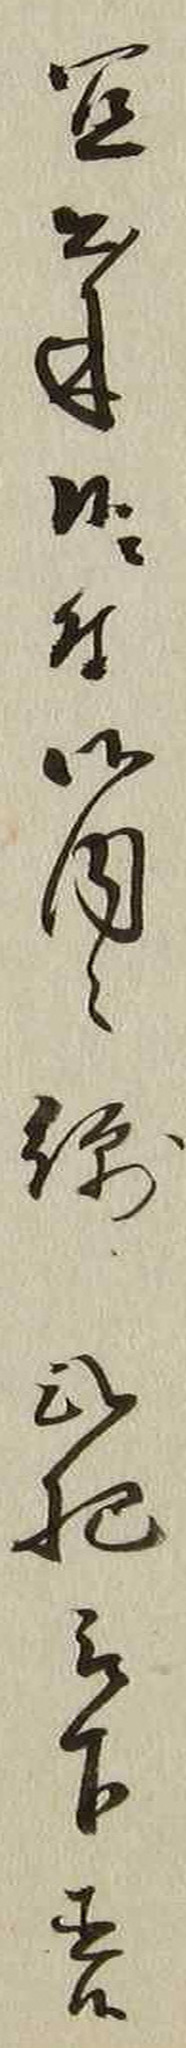宜出来候ニ付御内々綿弐肥被下置候
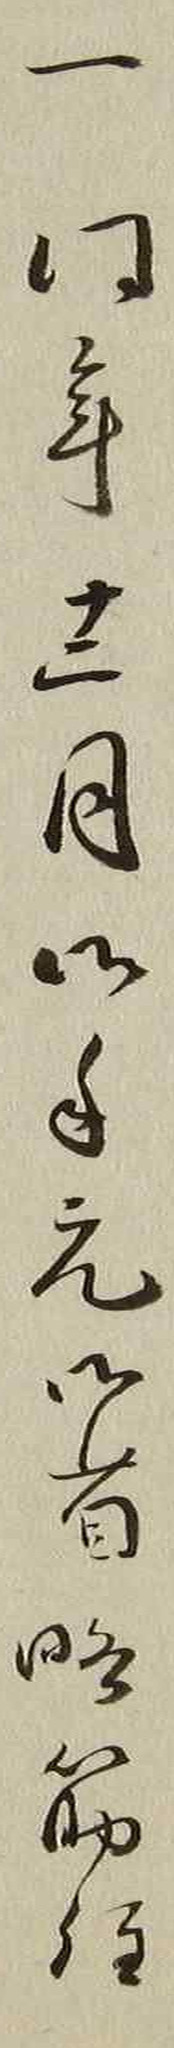一同年十二月御手元御省略筋任
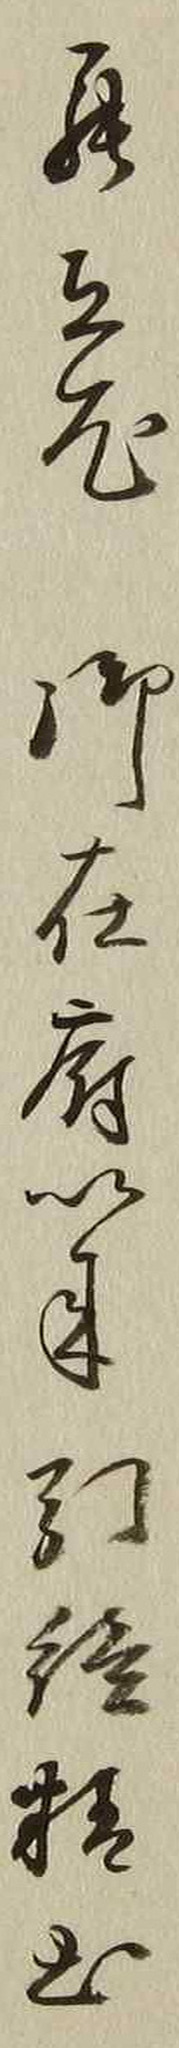罷在尤御在府以来引続精出
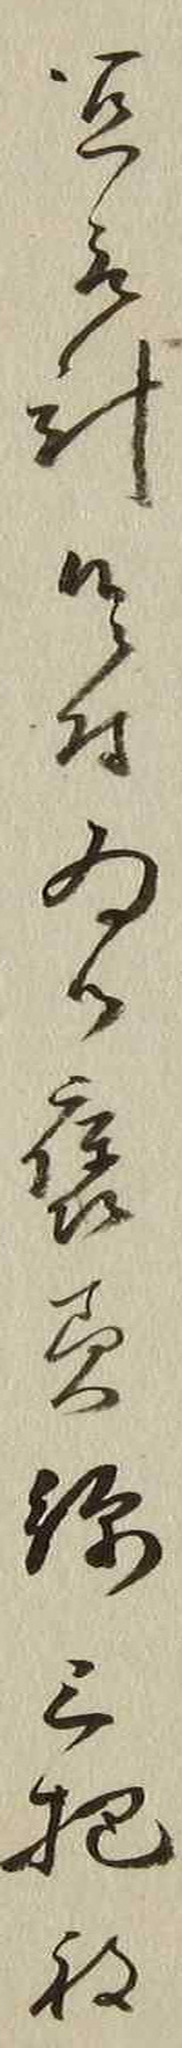宜取計候ニ付為御褒美綿三把被
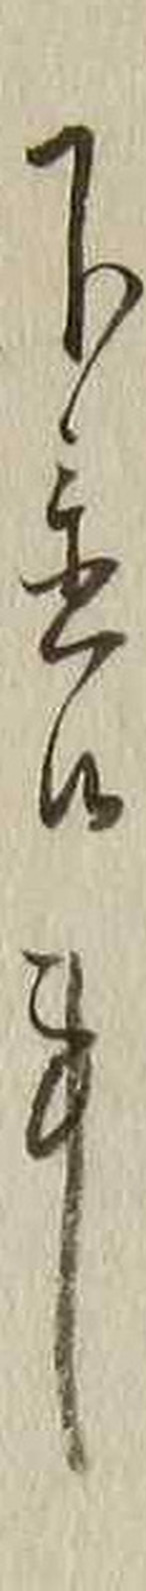下置候事
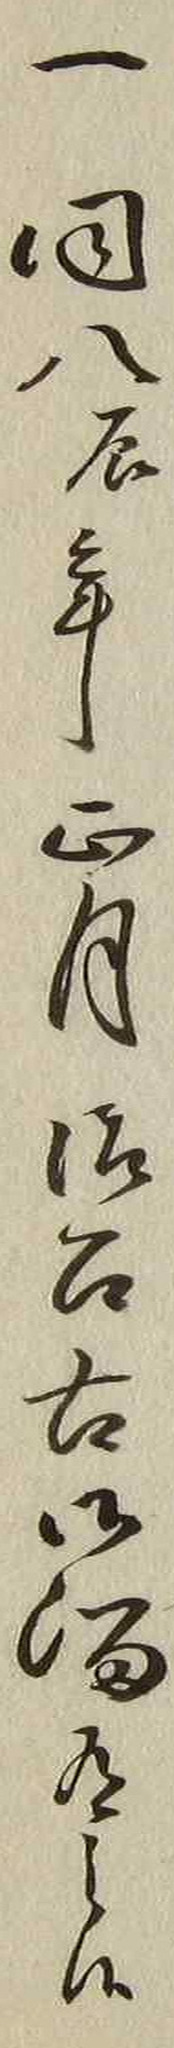一同八辰年正月御召古御溜有之候
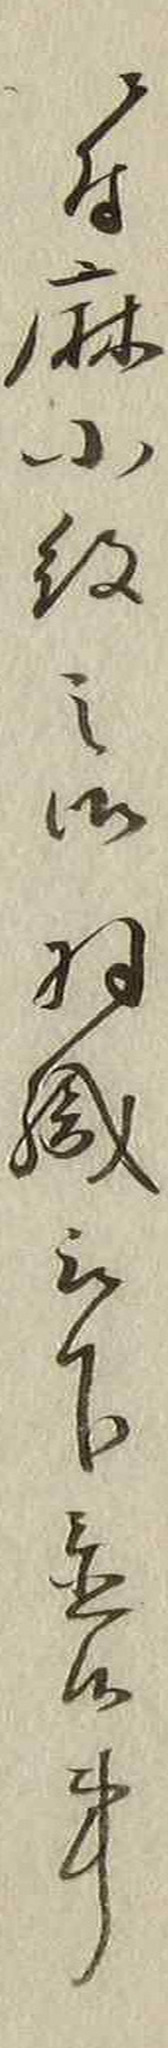ニ付麻小紋之御羽織被下置候事
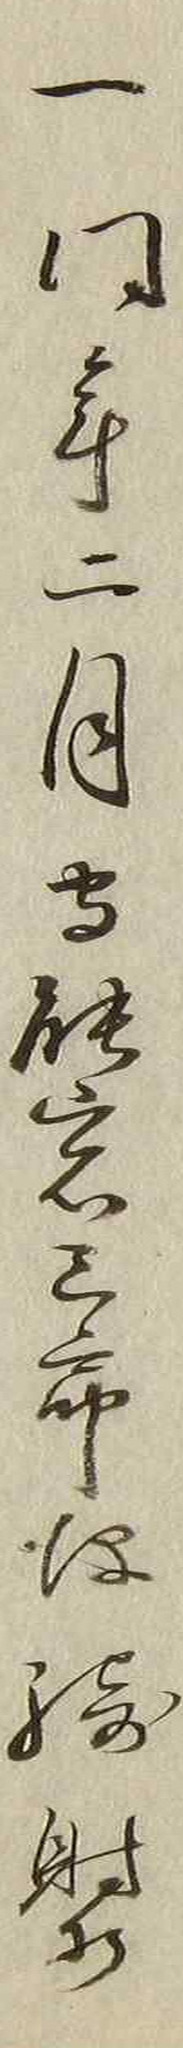一同年二月守能岩三郎儀騎射打
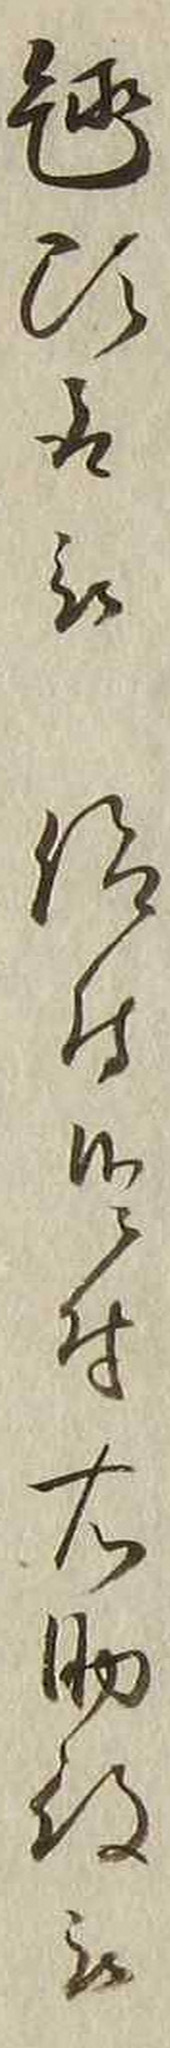毬頭取被仰付候ニ付右助役被
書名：諸士系譜　巻之25　い之部25
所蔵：会津若松市立会津図書館
